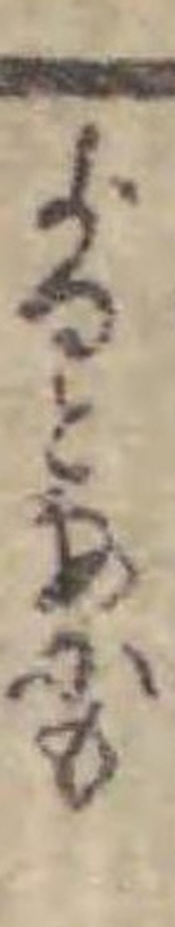よるとあにも
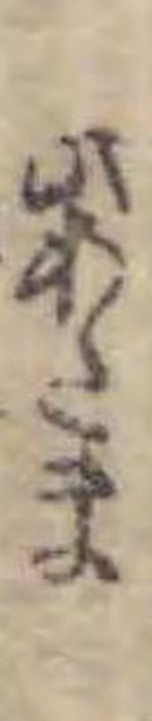此あたま
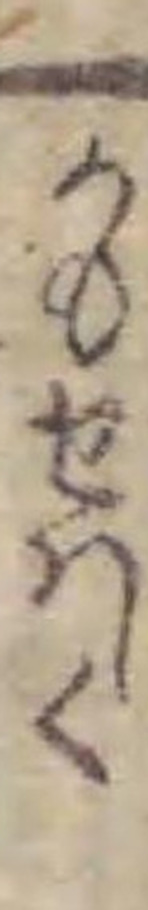かもせはしく
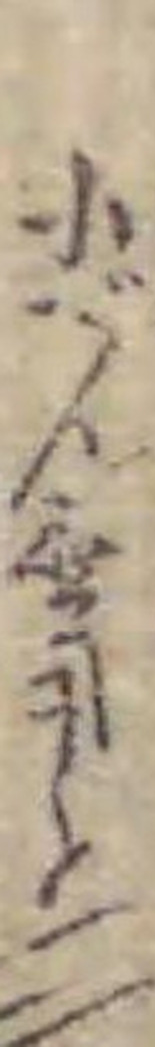小べん無用と
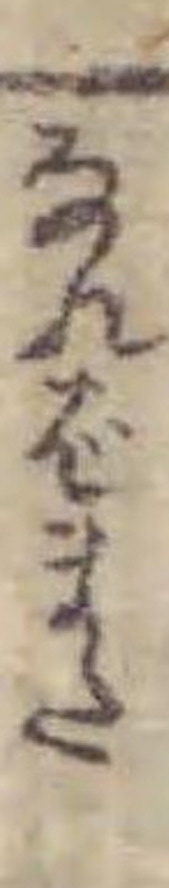なればまた
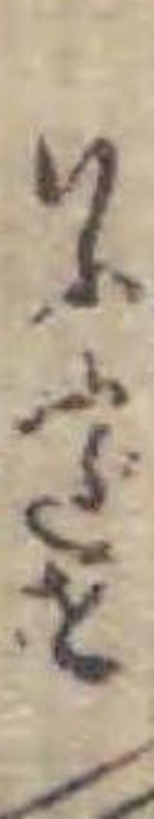いふふだを
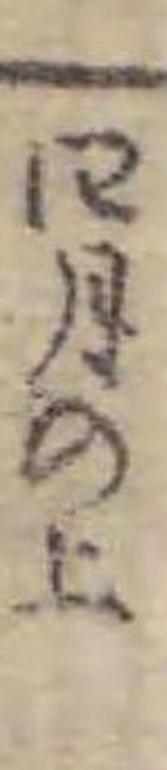四月の上
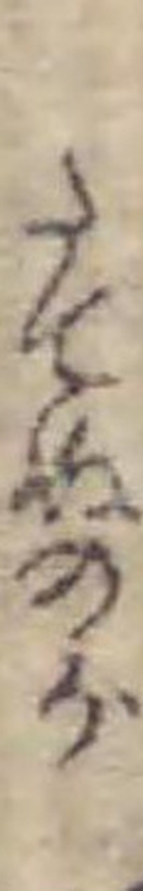たてぬのが
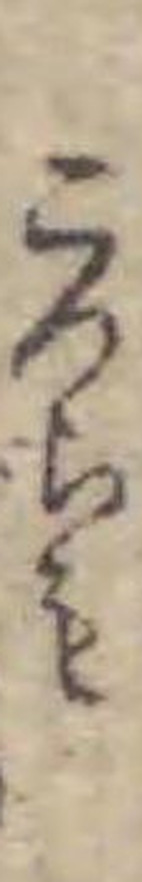こつちも
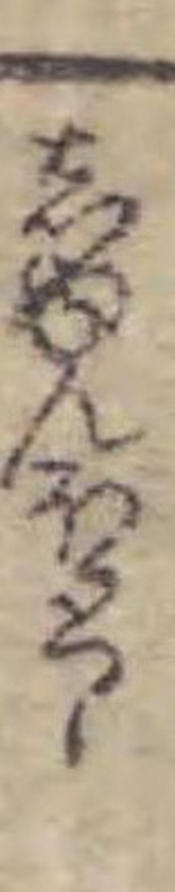しゆんほとし
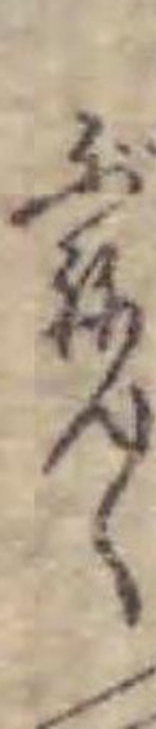ぶねん〳〵
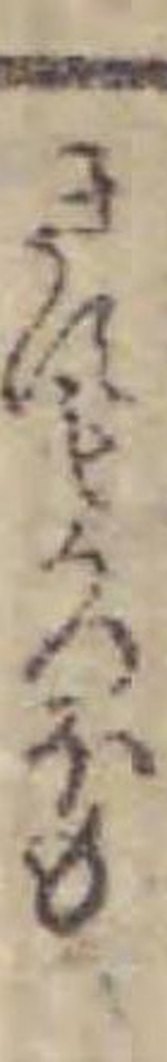きにもかつほも
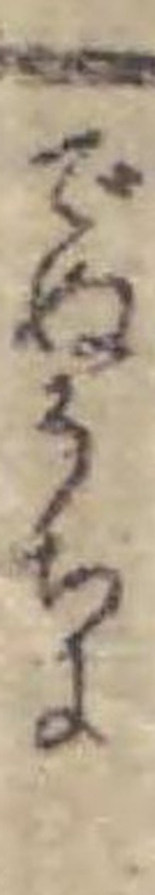でぬうちに
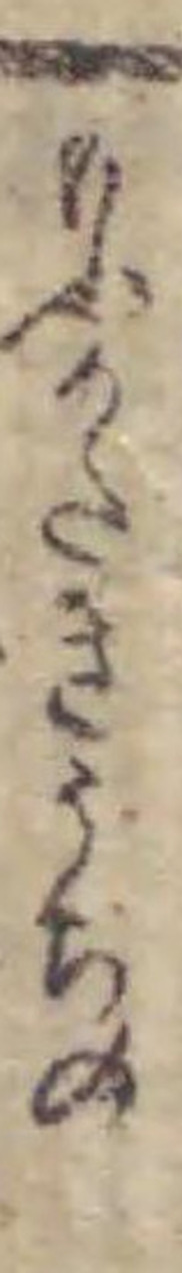もふかたきうちの
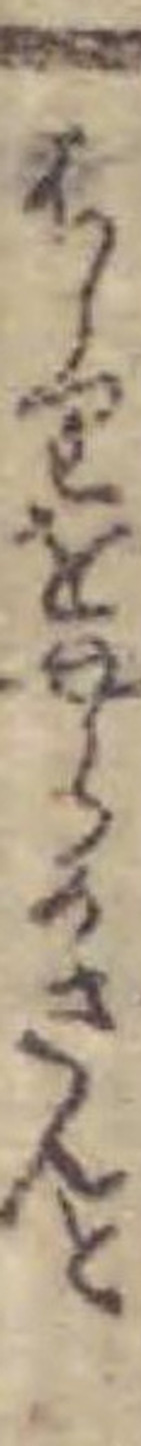はしりをやらかさんと
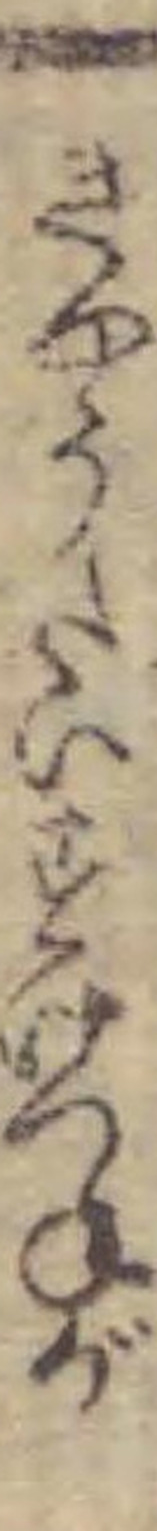きやうたいすけつねが
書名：年寄之冷水曽我 : 3巻
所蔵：国立国会図書館 National Diet Library, JAPAN
